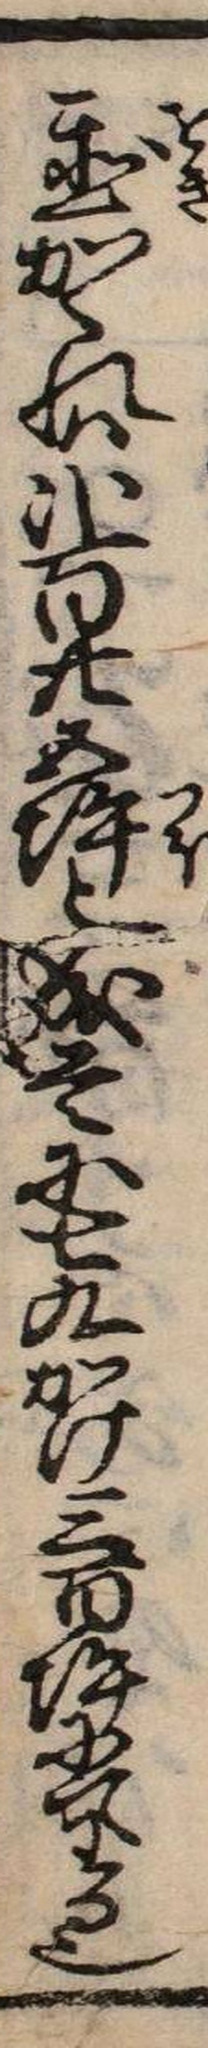置かくれは弐百廿五坪と成是に七九かけ三百坪にてわる也

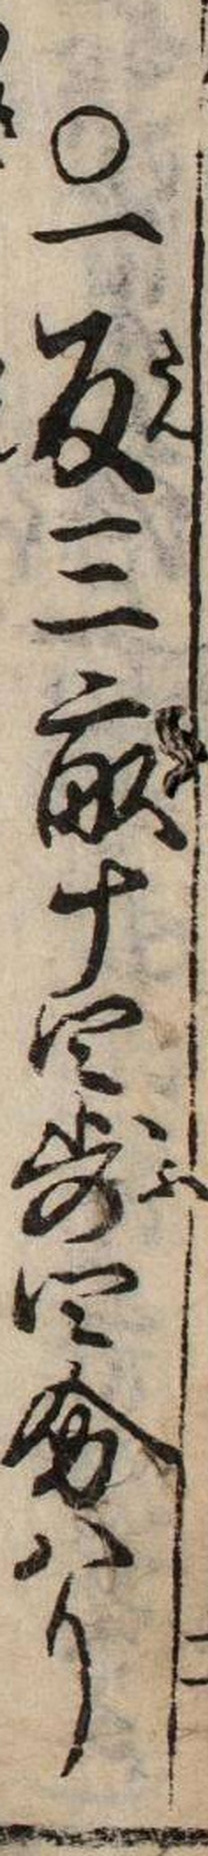○一反三畝十四歩四分八り
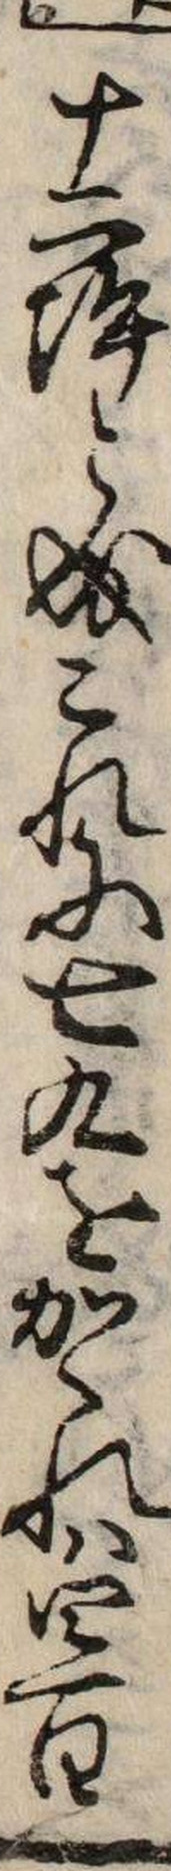十二坪と成これに七九をかくれは四百
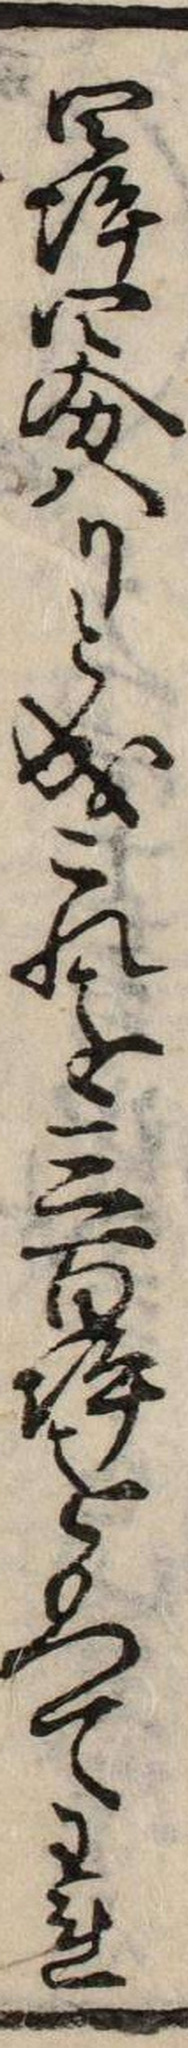四坪四分八りと成これを三百坪をもつてわれ
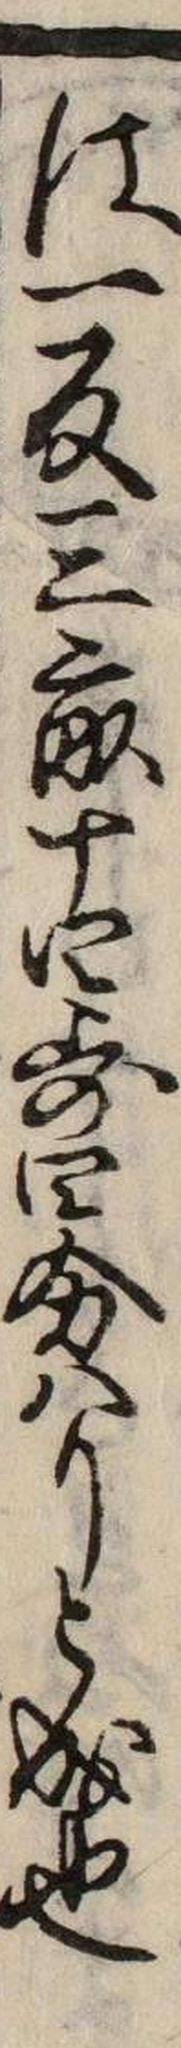は一反三畝十四歩四分八りと成也
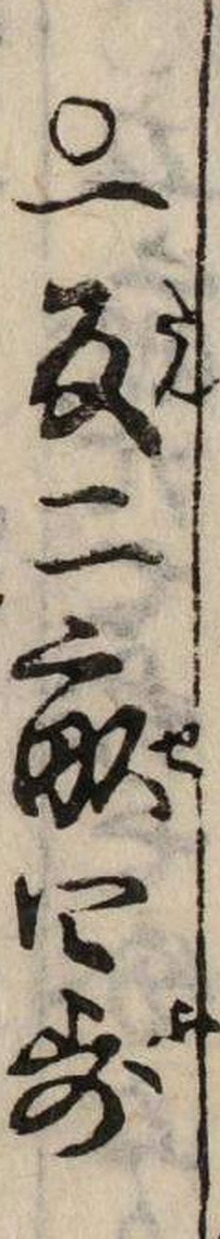○一反二畝四歩
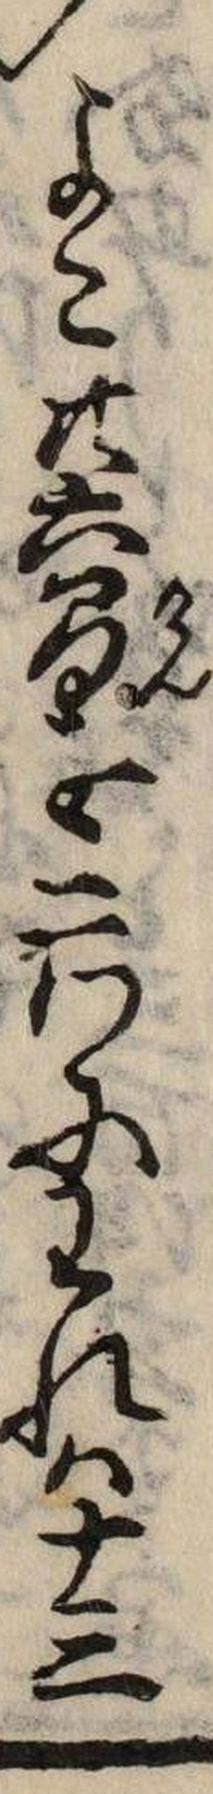よこ廿六間を二つにわれは十三
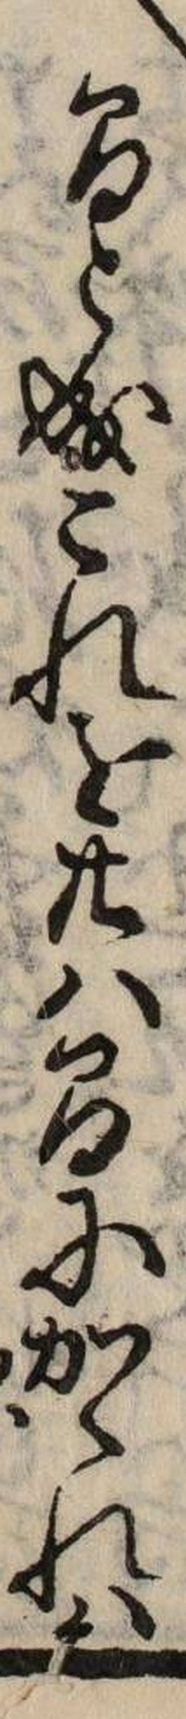間と成これを廿八間にかくれは
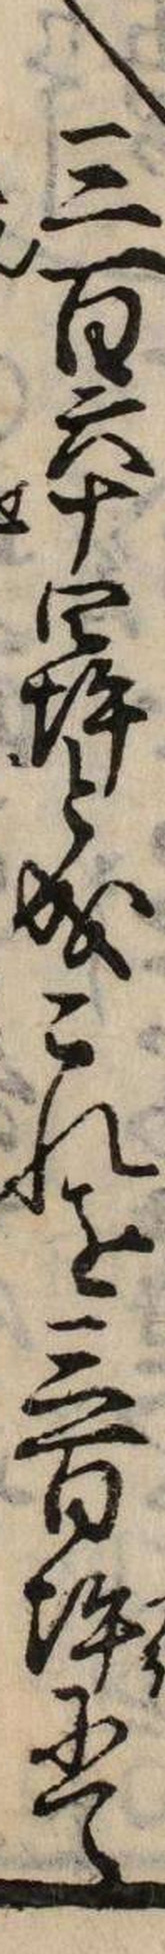三百六十四坪と成これを三百坪にて
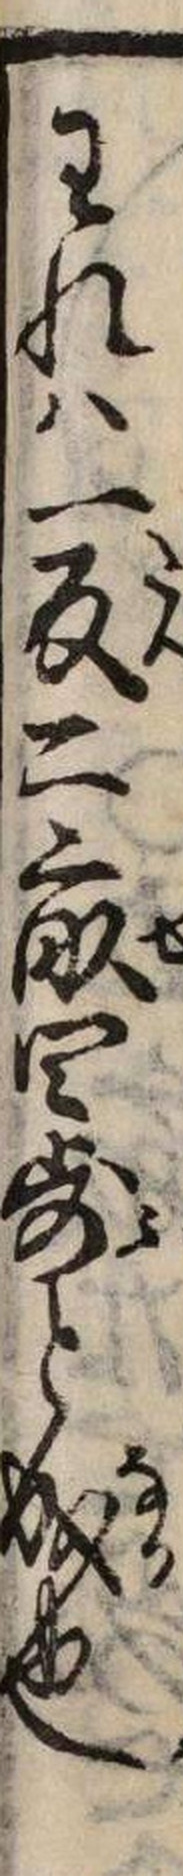われは一反二畝四歩と成也
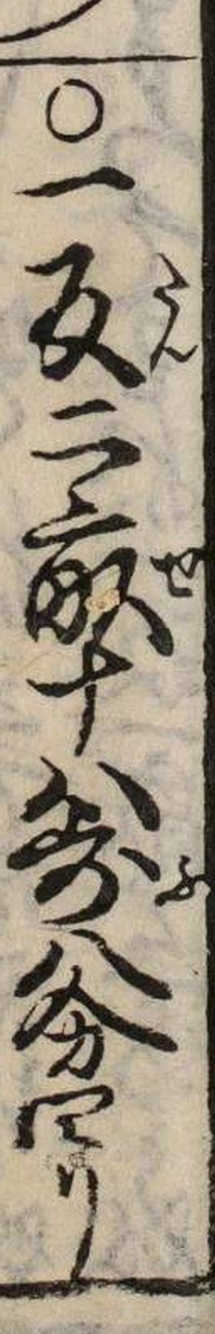○一反二畝十八歩八分四り
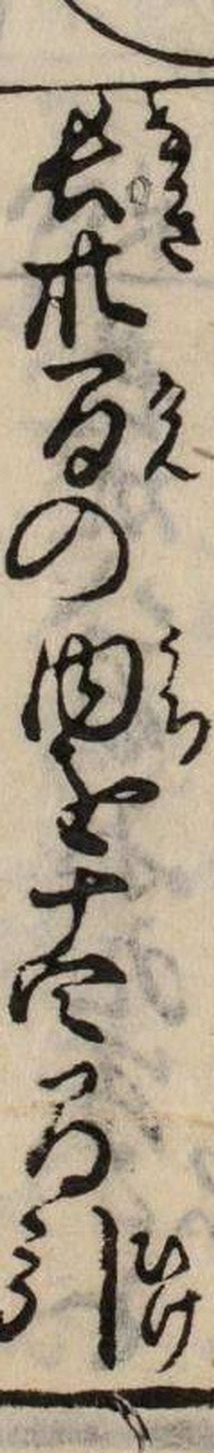長丗間の内を十四間引
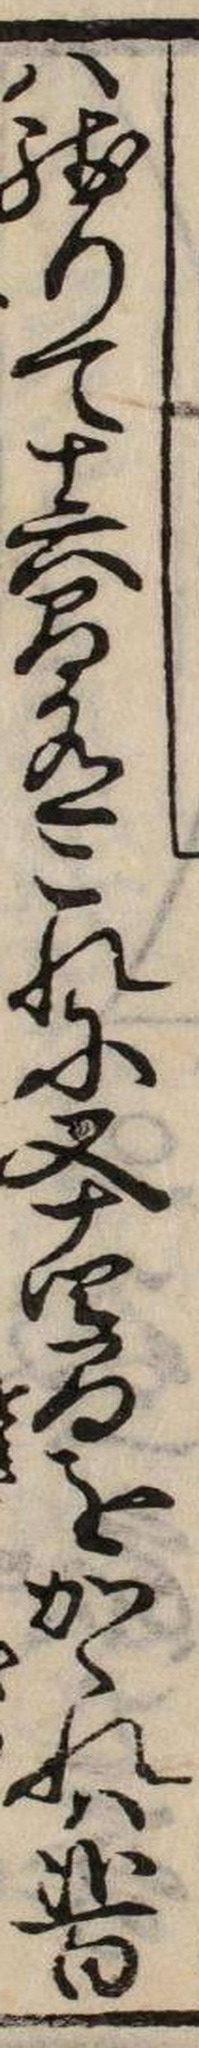は残りて十六間有これに又十四間をかくれは弐百
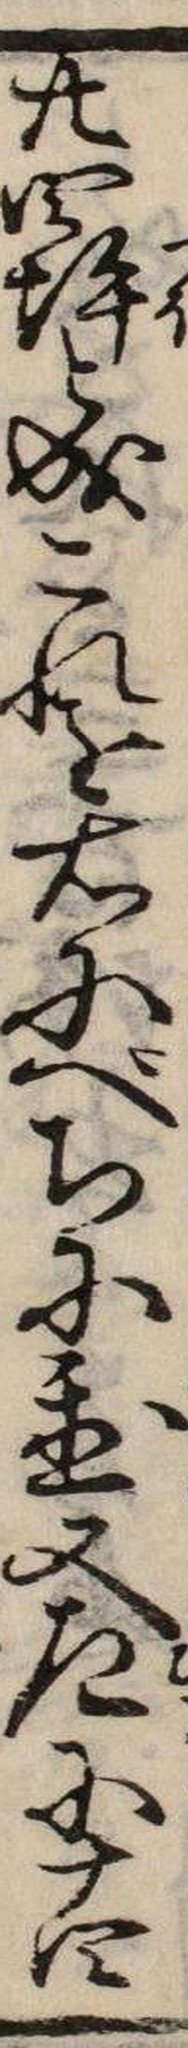廿四坪と成これを右にべちに置又左に十四
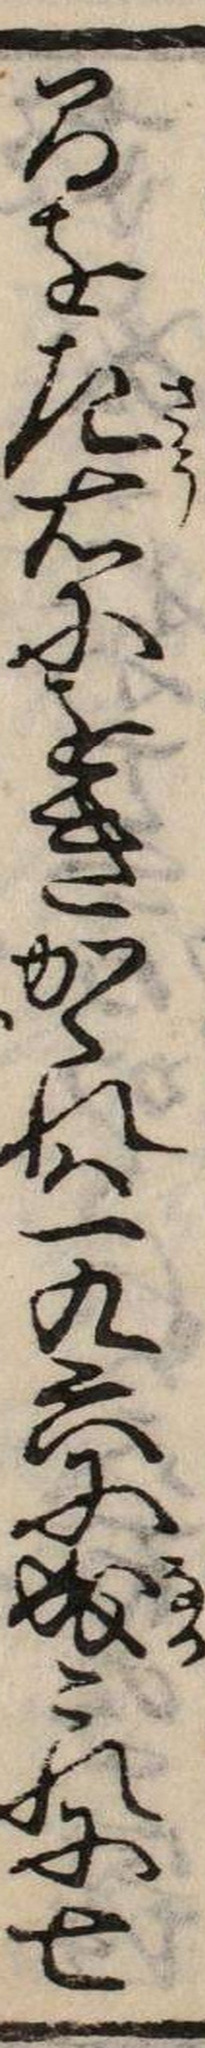間を左右にをきかくれは一九六に成これに七
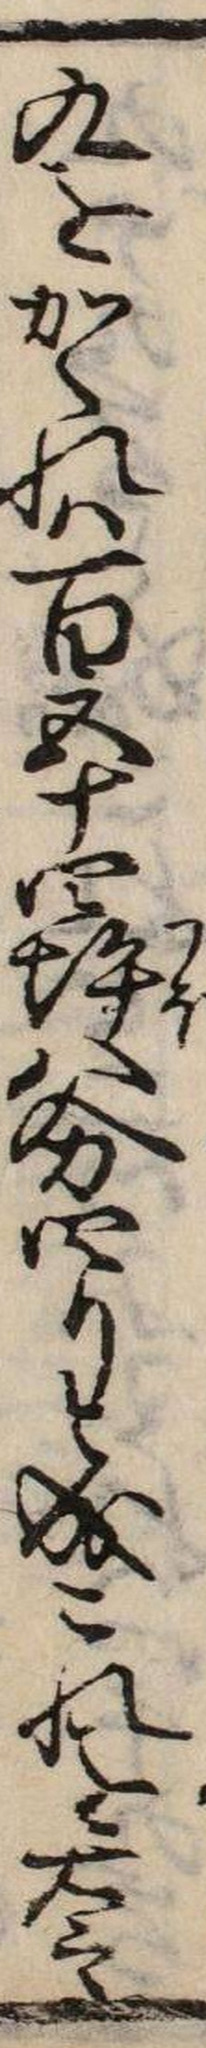九をかくれは百五十四坪八分四りと成これを右の
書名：塵劫記（寛永11年自跋、京都府立京都学・歴彩館追貴8）
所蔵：京都府立京都学・歴彩館 国文学研究資料館
